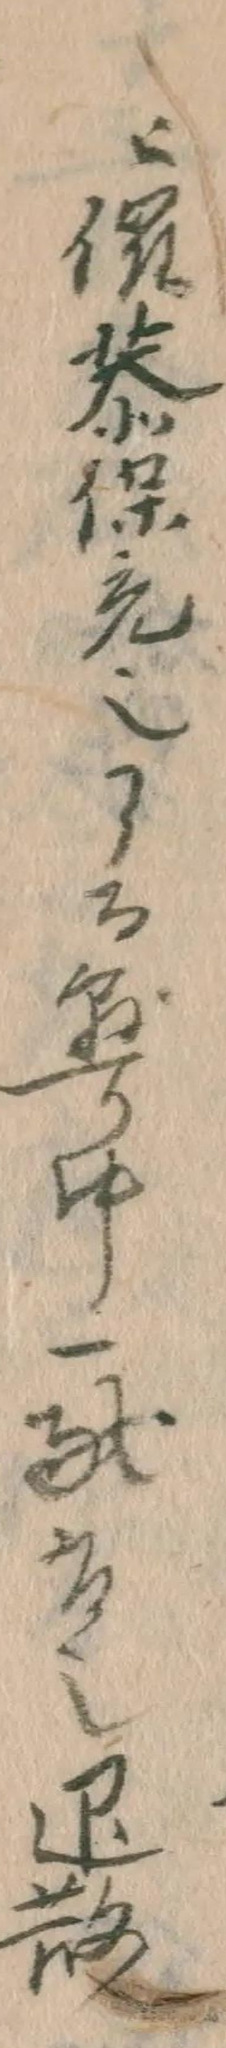被催恭保充也了而懸リ中一献有之退散
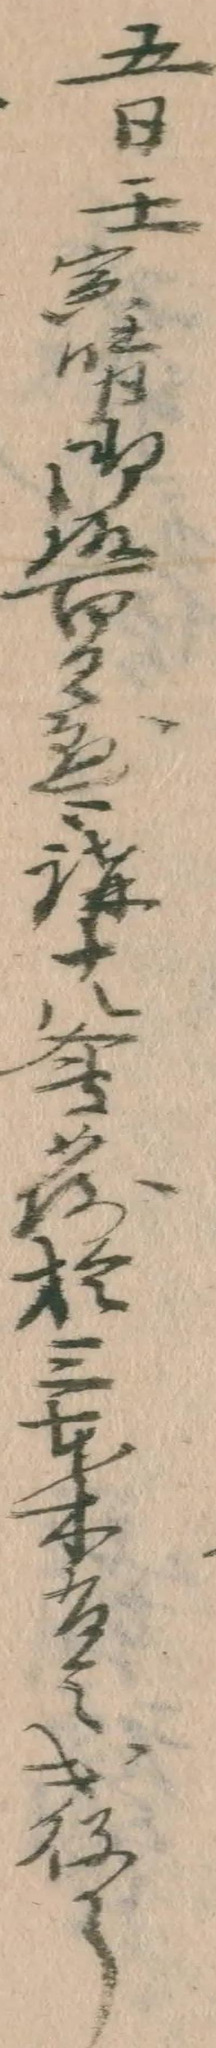五日壬寅晴御殿百匁懸御講十八會如例於三本木有之出役了
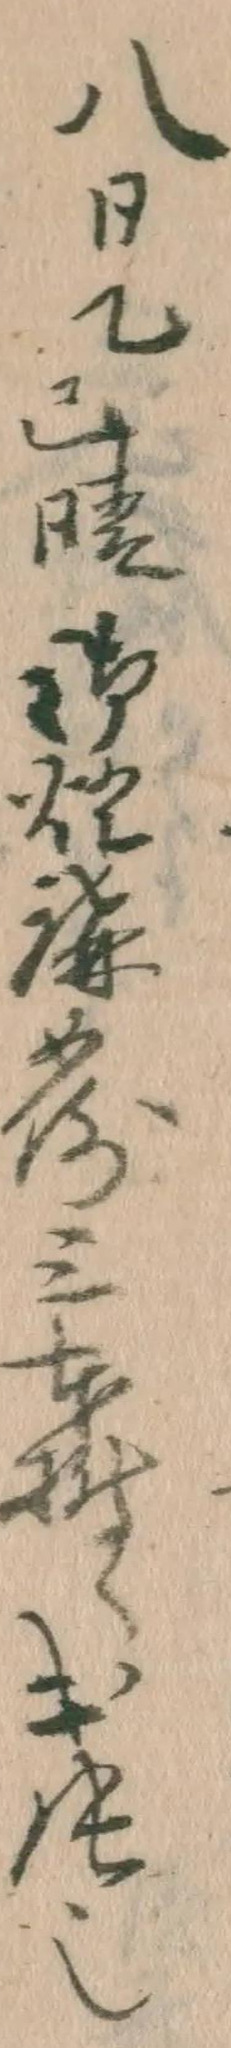八日乙巳曇御燈講如例三本村へ出張也
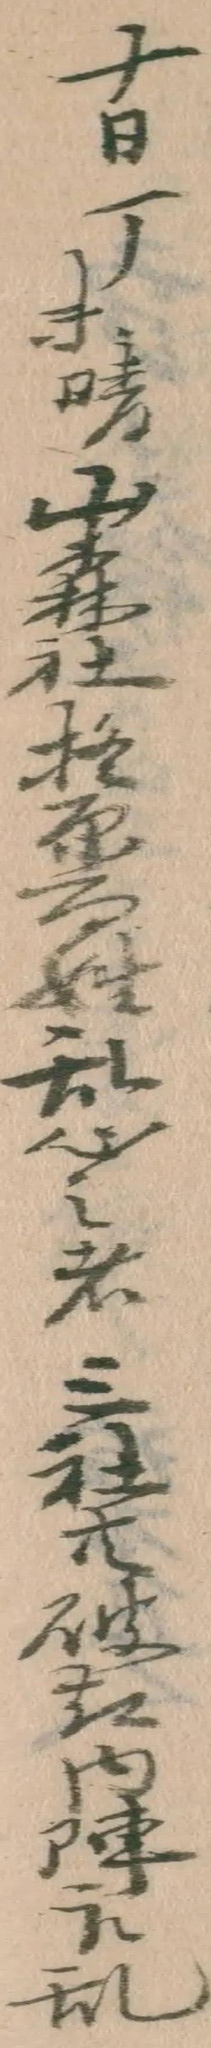十日丁未晴山森社柊原百姓乱心之者三社共破却内陣取乱
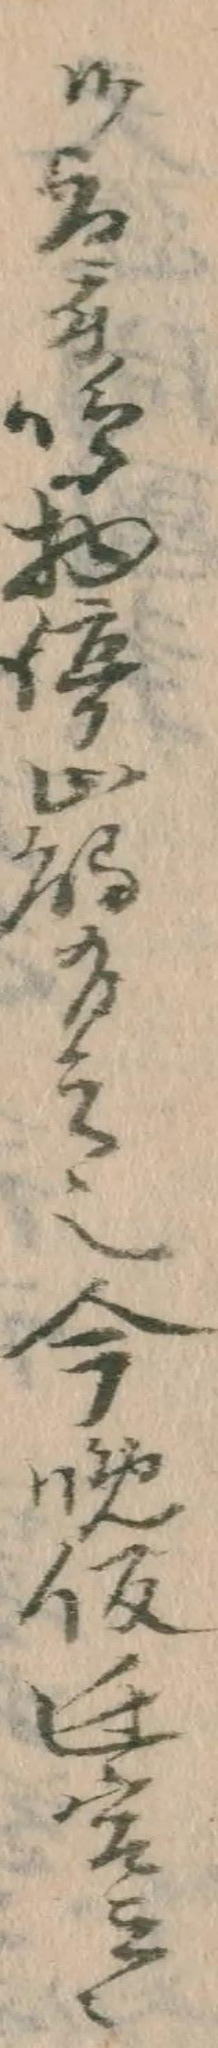候旨に付鳴物停止觸有之也今晩仮遷宮云々
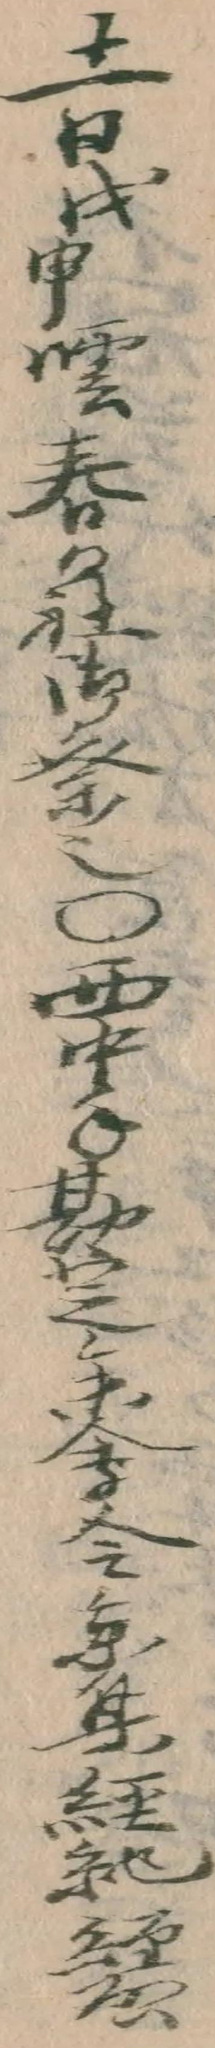十一日戊申曇春日社御祭也○西中手勘定参會令参集経紀経啓
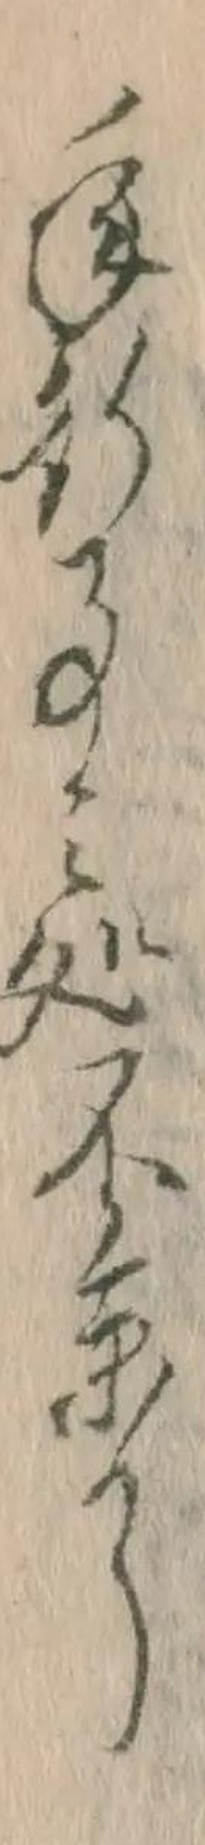年行事之処不参了
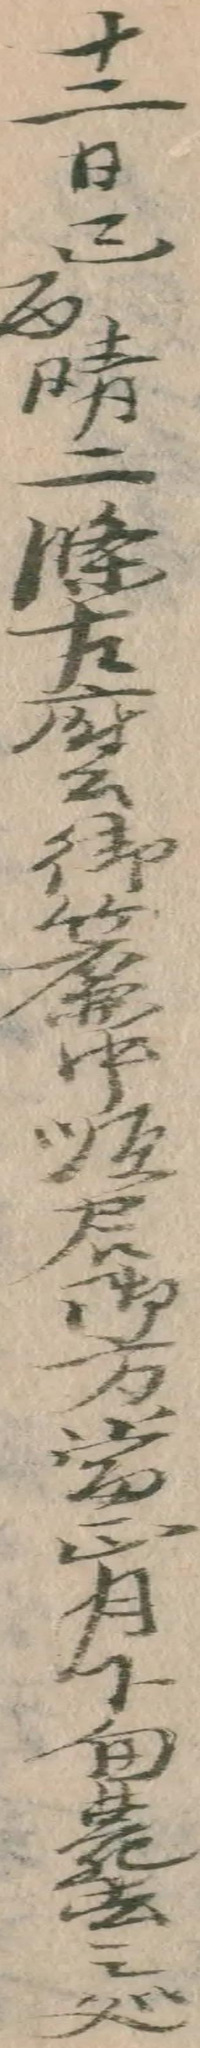十二日己酉晴二條左府公御簾中順君御方當正月下旬薨去之処
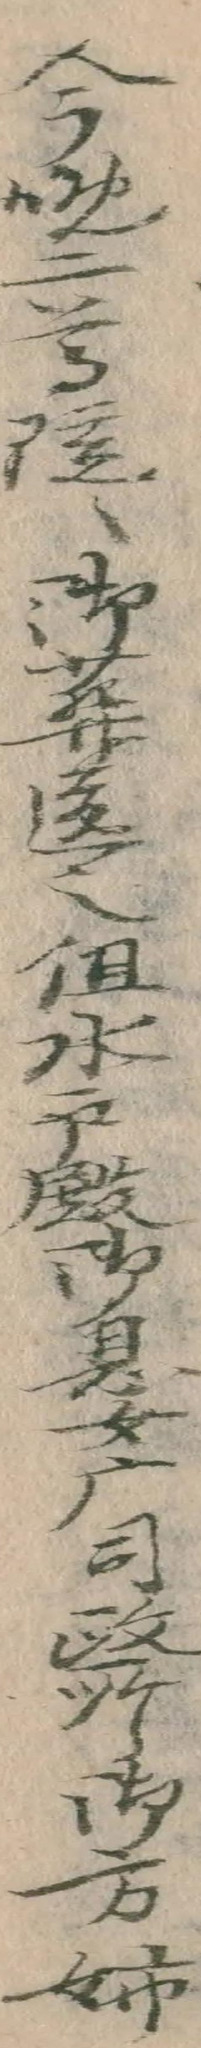今晩二尊院へ御葬送也但水戸殿御息女鷹司政所御方姉
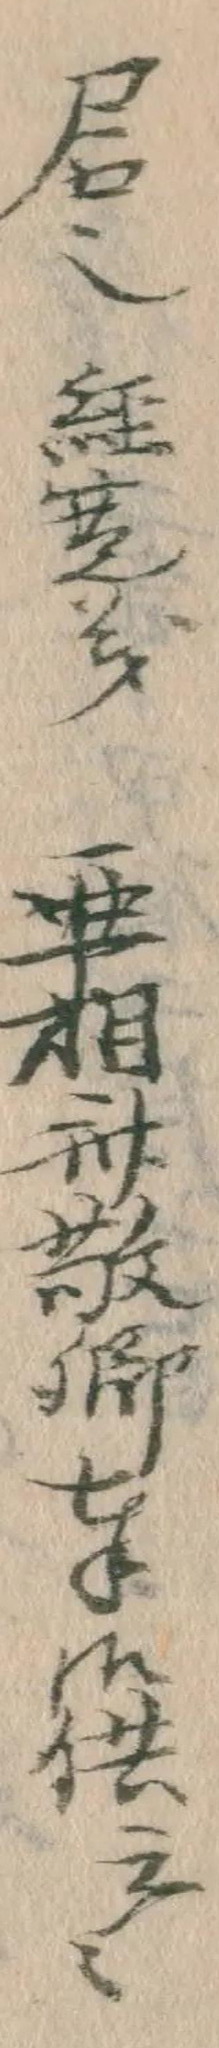君也経寛義亜相斉敬卿奉御供云々
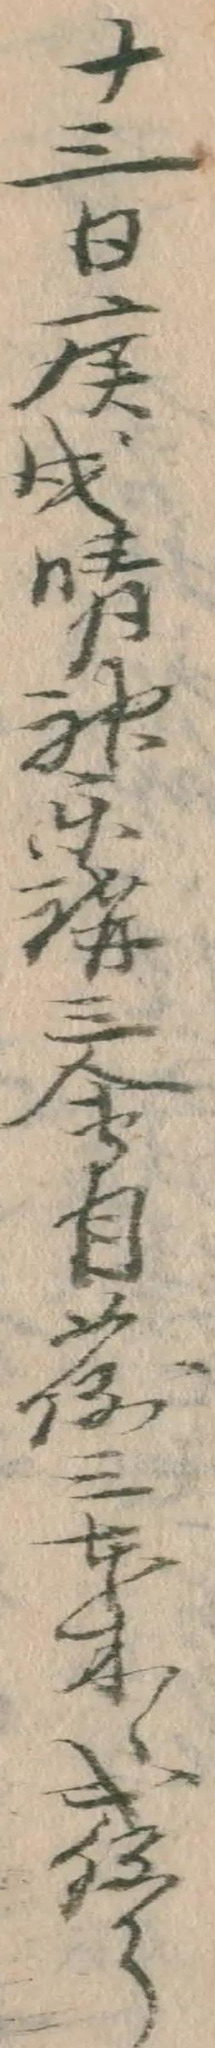十三日庚戌晴神楽講三會目如例三本木へ出役了
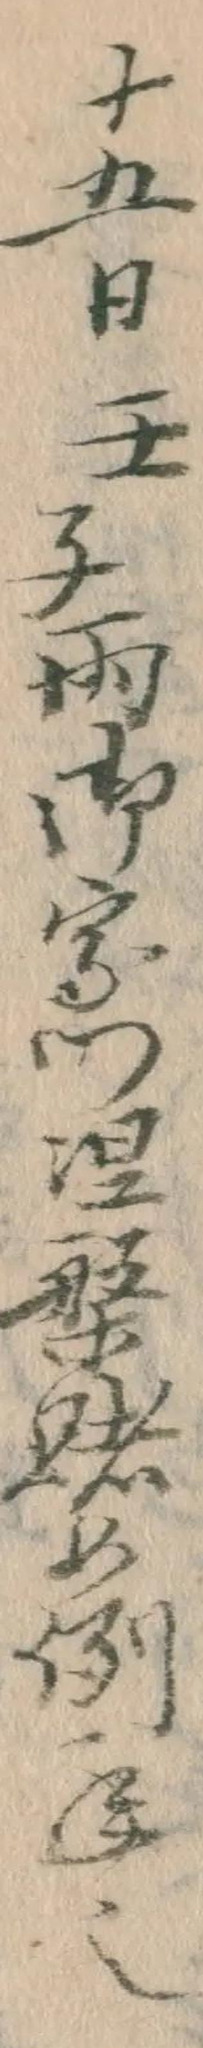十五日壬子雨御家門涅槃賭如例年也
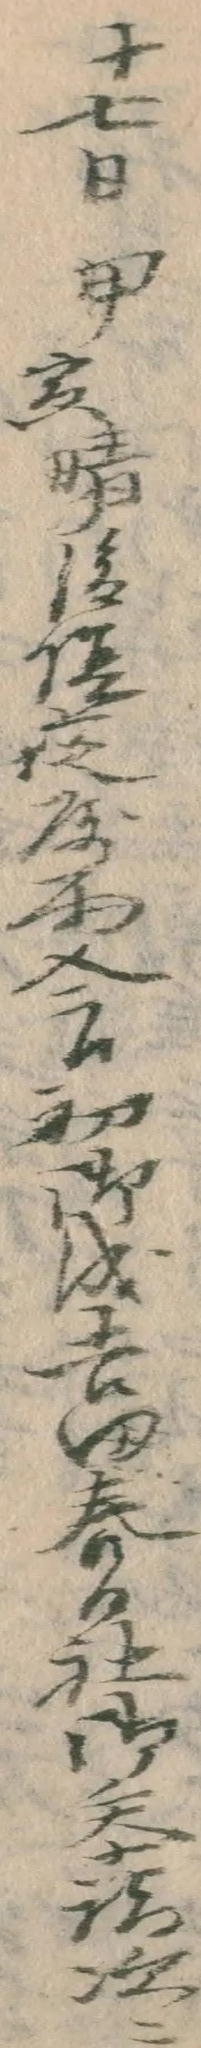十七日甲寅晴後陰夜属雨今日初御成吉田春日社御参詣次二
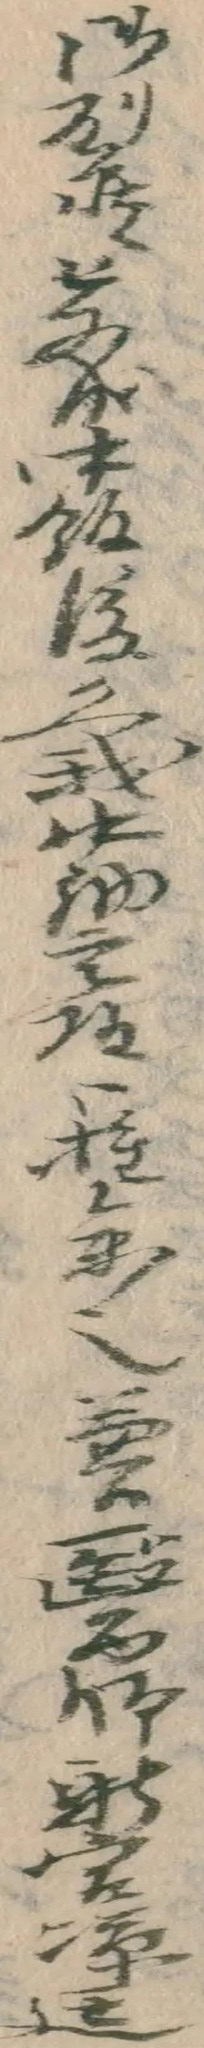御別荘へ被為成中飯後久我中納言殿御推参也兼日醫酉師新宮涼庭
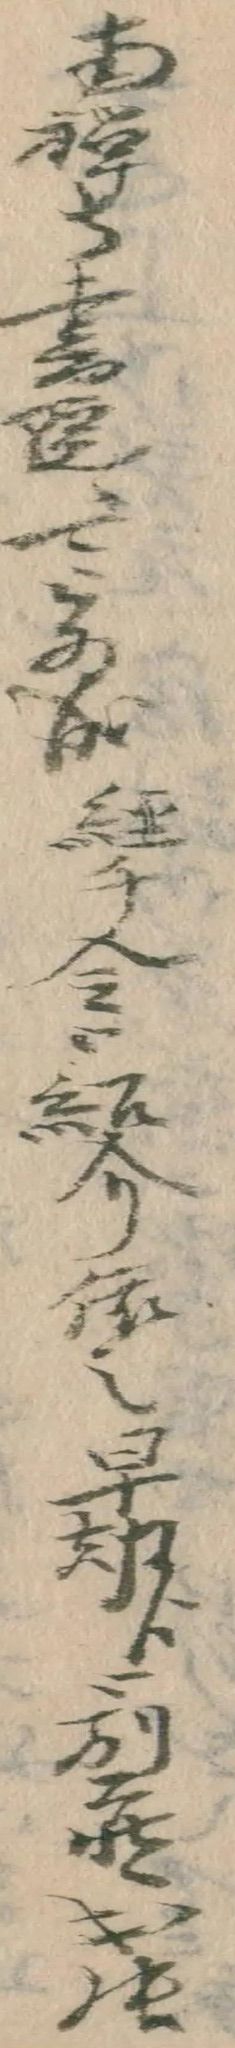南禅寺書院ヘ可被為経千今日紹介依之早朝ゟ御別荘出張

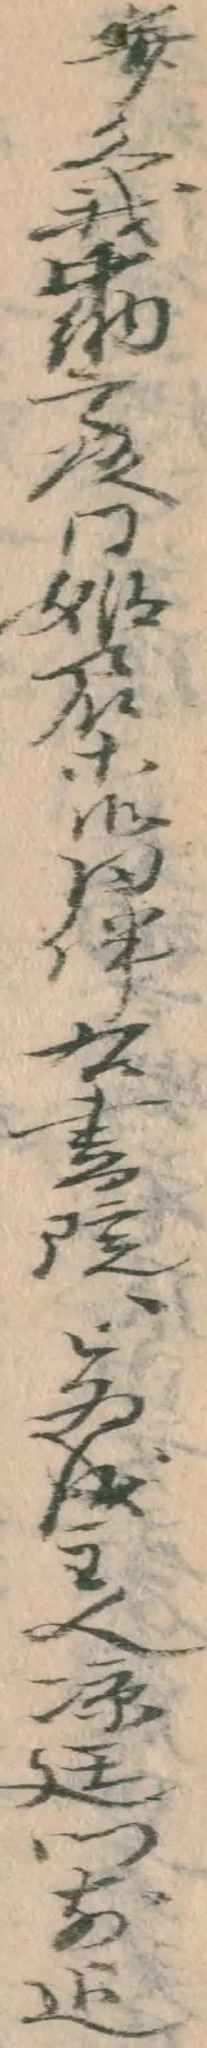幷久我中納言殿同姫君等御同伴右書院へ被為成主人涼廷床延門前迄
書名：賀茂社記録. 第69冊
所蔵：国立国会図書館 National Diet Library, JAPAN
